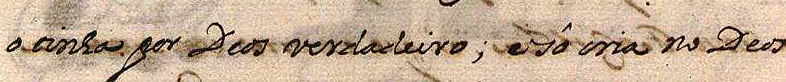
o tinha por Deos verdadeiro; e só cria no Deos
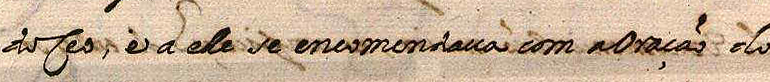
do Ceo, e a elle se encomendaua com a Oraçaõ do
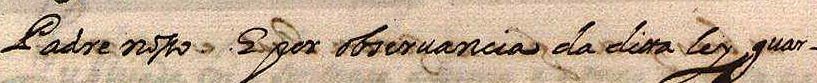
do Padre nosso. E por obseruancia da ditta ley guar
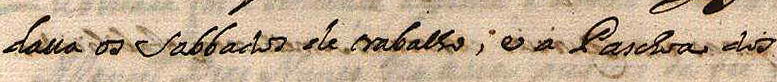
daua os sabbados de trabalho; e a Paschoa dos
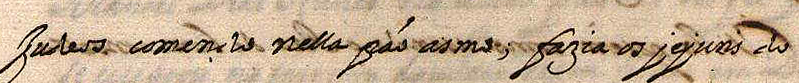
Judeos, comendo nella pão asmo; fazia os jejuns do
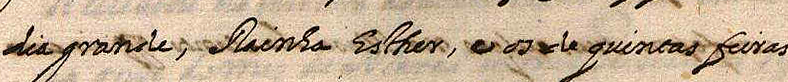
dia grande, Rainha Esther, e os de quintas feiras,
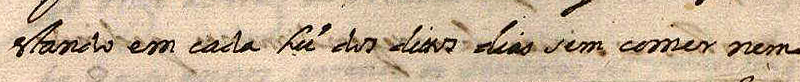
estando em cada hū dos dittos dias sem comer nem
